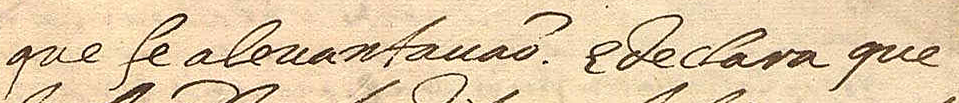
que se aleuantauaõ. E declara que
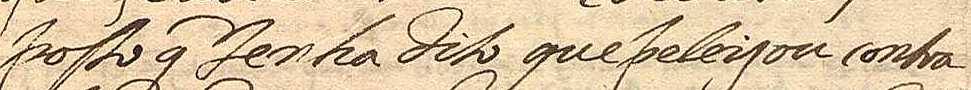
posto q̄ tenha dito que peleijou contra
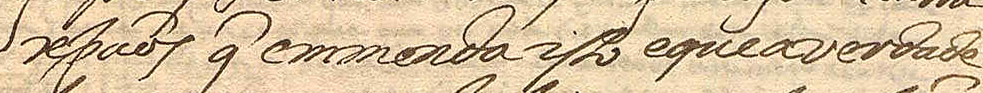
xpaõs q̄ emmenda isso e que a verdade
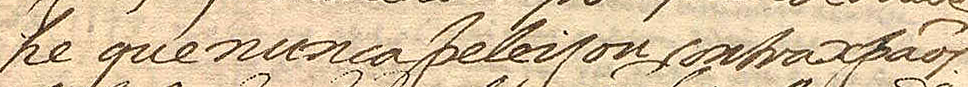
he que nunca peleijou contra xpaõs
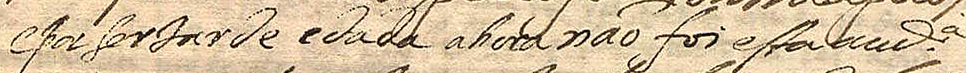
e por ser tarde e dada a hora naõ foi esta aud.a
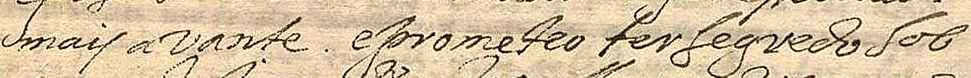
mais avante. e prometeo ter segredo sob
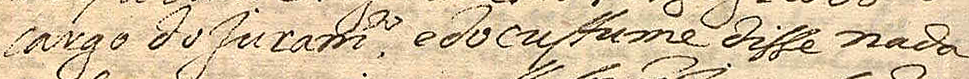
cargo do Juramto, e do custume disse nada
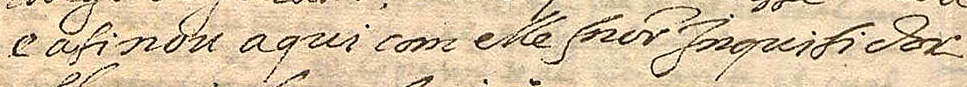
e asinou aqui com elle snor̄ Jnquisidor
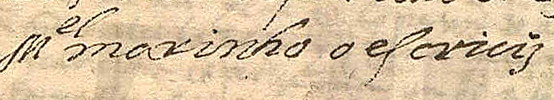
Mel marinho o escriuj
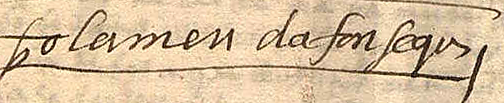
b̄olameu da fonseqa
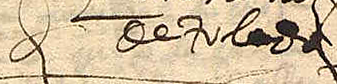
de toledo
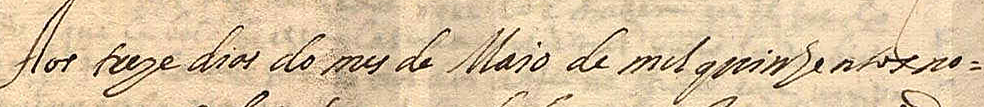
Aos treze dias do mes de Maio de mil quinhentos no
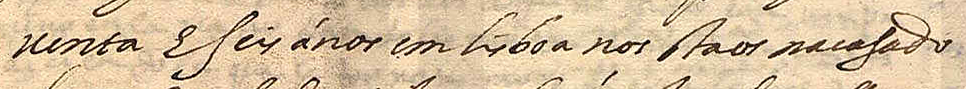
uenta E seis anos em lisboa nos staos na casa do
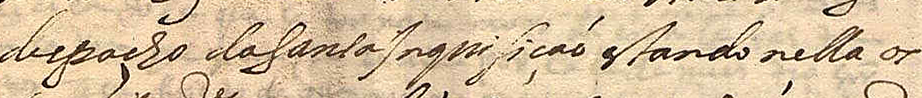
despacho da santa Jnquisiçaõ estando nella os
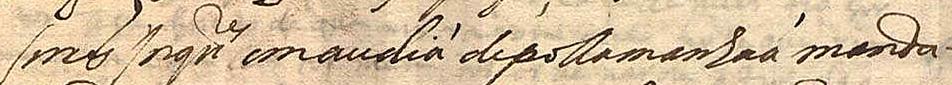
snres̄ Jnqures em audiā de polla manhaā manda
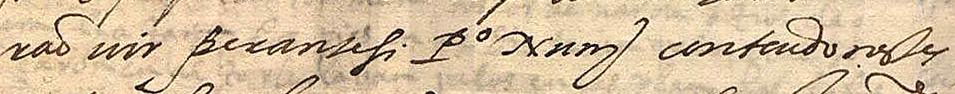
raõ uir perante si Po Nunz̄ conteudo nestes
